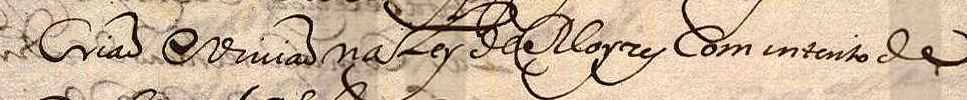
Criaõ E viuiaõ na Ley de Moyzes Com intento de
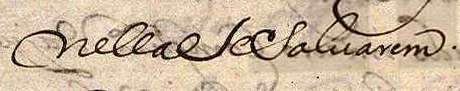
nella Se Saluarem.
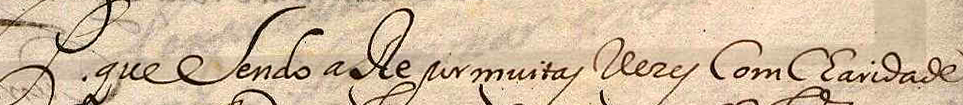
P. que Sendo a Re por muitas vezes Com Charidade
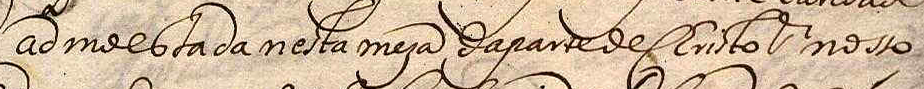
admoestada nesta meza da parte de Christo sor nosso
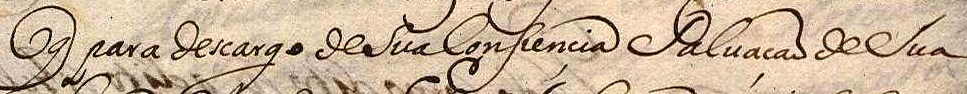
q̄ para descargo de Sua Consiencia Saluaçaõ de Sua
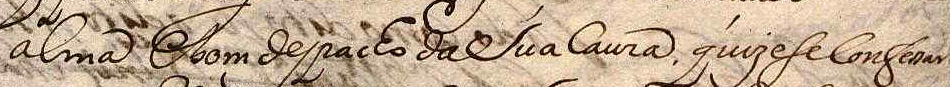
alma E bom despacho da Sua Cauza, quizese Confessar
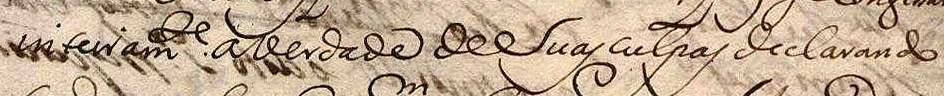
inteiram.te a verdade de Suas culpas declarando
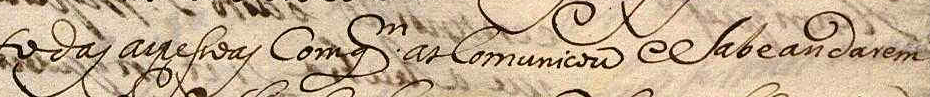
todas as pessoas Com q.m as Comunicou, e Sabe andarem
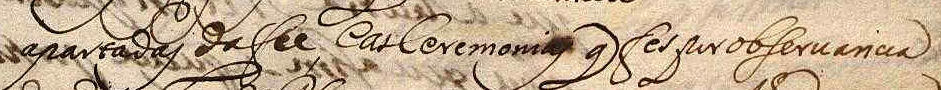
apartadas da fee, e as Ceremonias q̄ fes por obseruancia
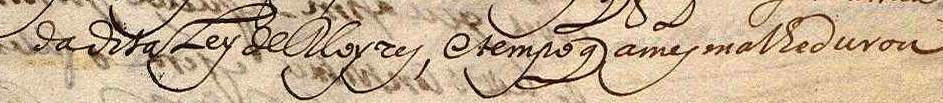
da dita Ley de Moyzes, e tempo q̄ a mesma lhe durou
